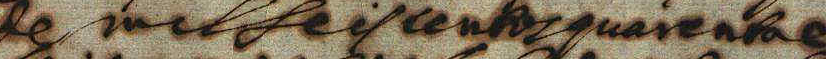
de mil seiscentos quarenta e
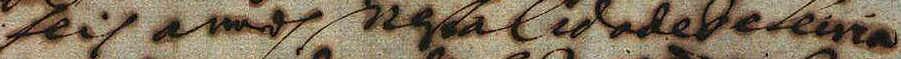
seis annos nesta Cidade de Leiria
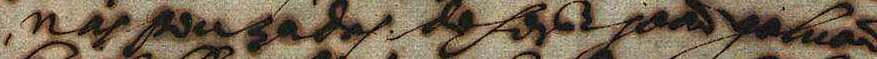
nas pousadas do sor̄ joaõ galuaõ
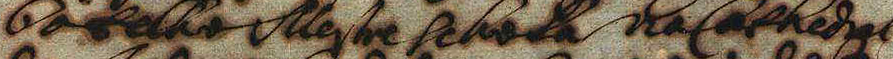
botelho Mestre schola na Cathedral
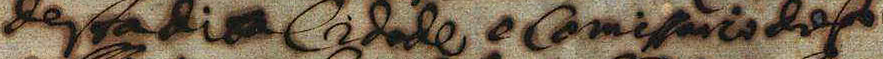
desta dita Cidade e Comissario do sto
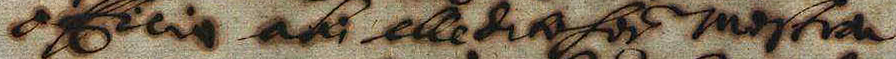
officio ahi elle dito sor̄ mostrou
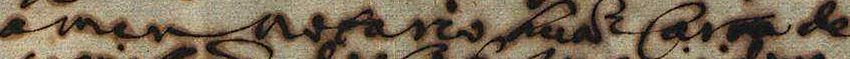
a meu notario huā Carta de
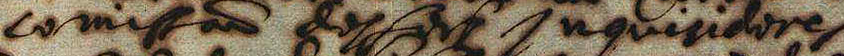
comissaõ dos sors̄ jnquisidores
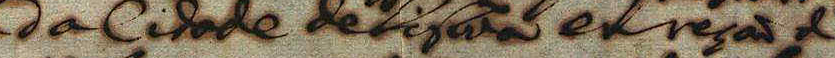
da Cidade de lisboa em rezaõ de
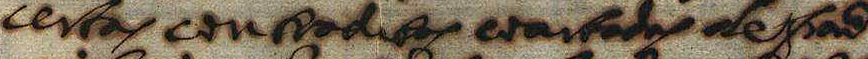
certas contraditas coartadas de franco
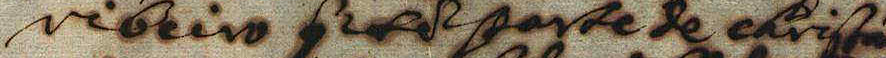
ribeiro q̄ tē parte de christaõ
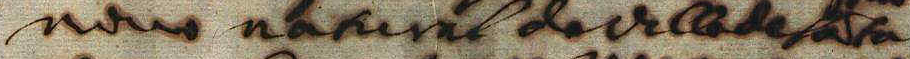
nouo natural de villa de sāta
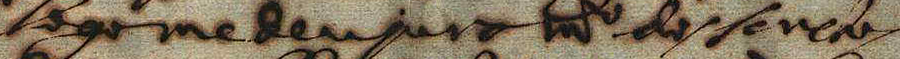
logo me deu juramto dos sanctos
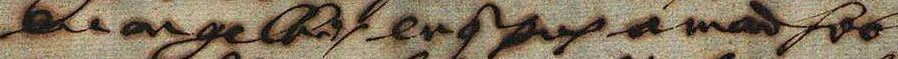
euangelhos em q̄ pos a maõ sob
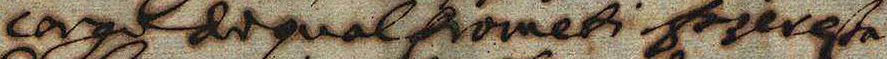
cargo do qual prometi fazer esta
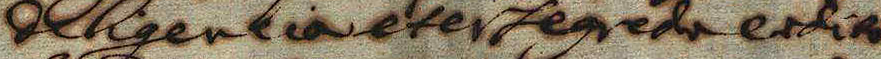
deligencia e ter segredo e o dito
